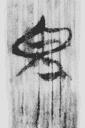畏
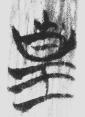皇
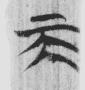天
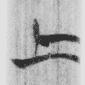上
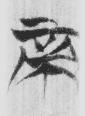帝
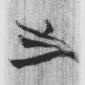之
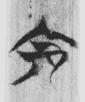命
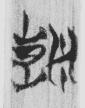朝
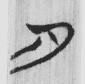夕
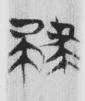{㣇聿}
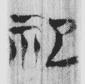祀
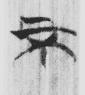不
